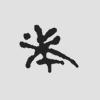未
